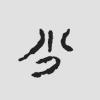少
